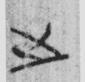之
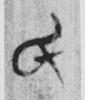氏（是）
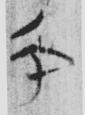○（師）
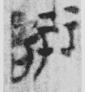訮
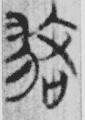{尋攴口}（尋）
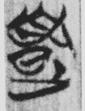{日止頁}（夏）
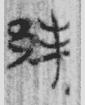邦
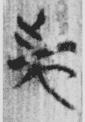蚩
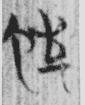蚘（尤）
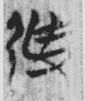{尸拃}
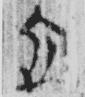兵
